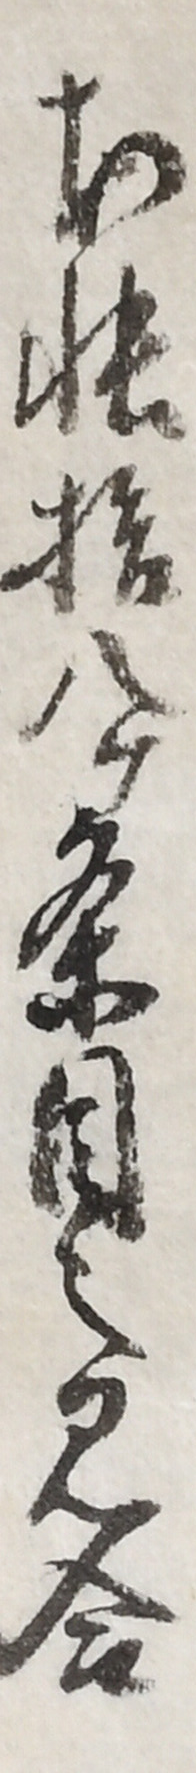本帳拾八ヶ条目之見合
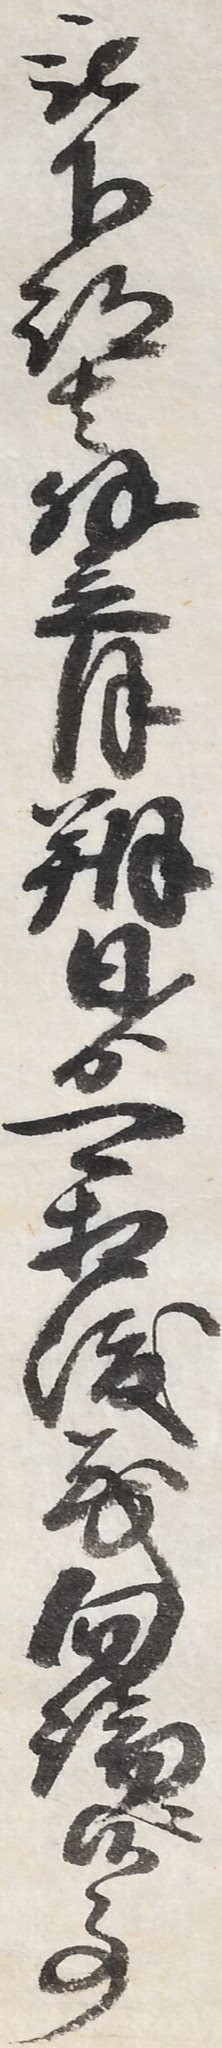被下跡は翌月朔日ゟ可相渡も勿論ニ候事
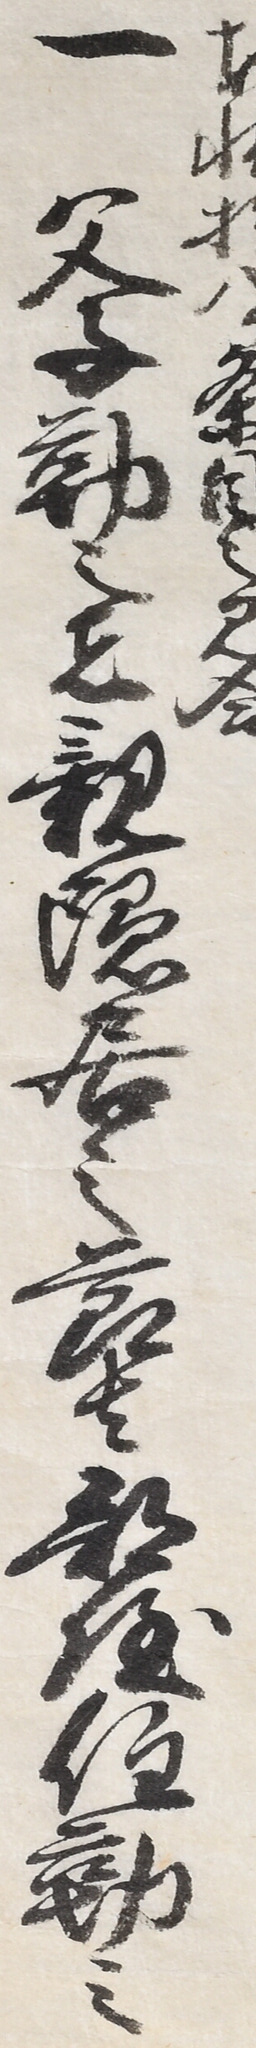一父子勤之者親隠居之節は部屋住勤之
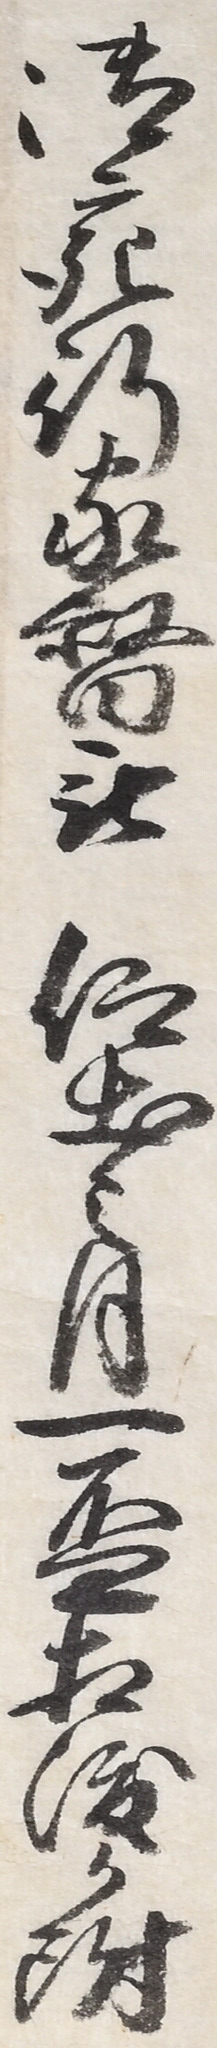御宛行家督被仰出之月一盃相渡候附
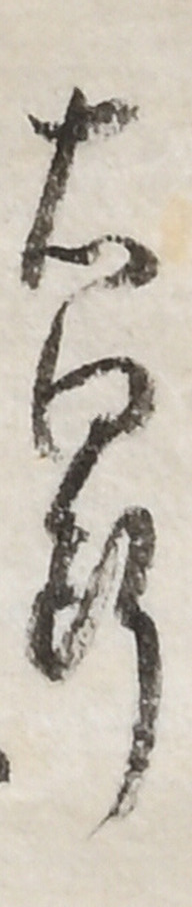右同断
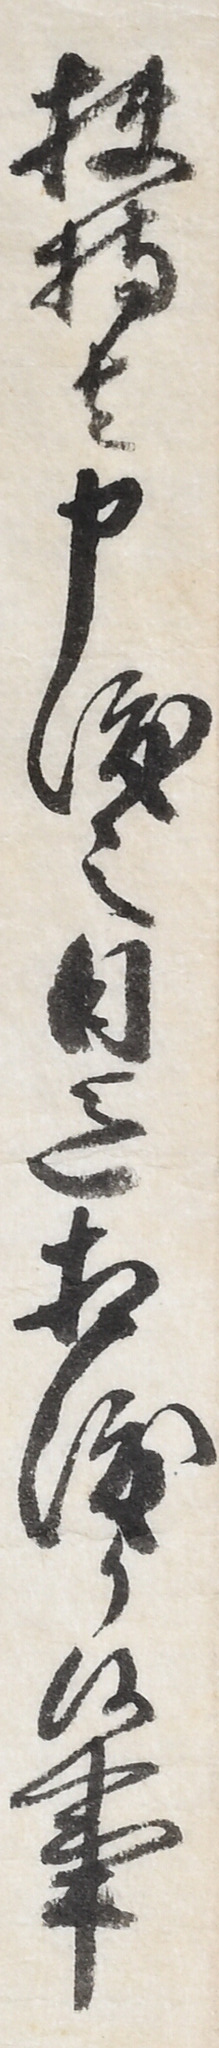扶持は申渡之日迄相渡り候事
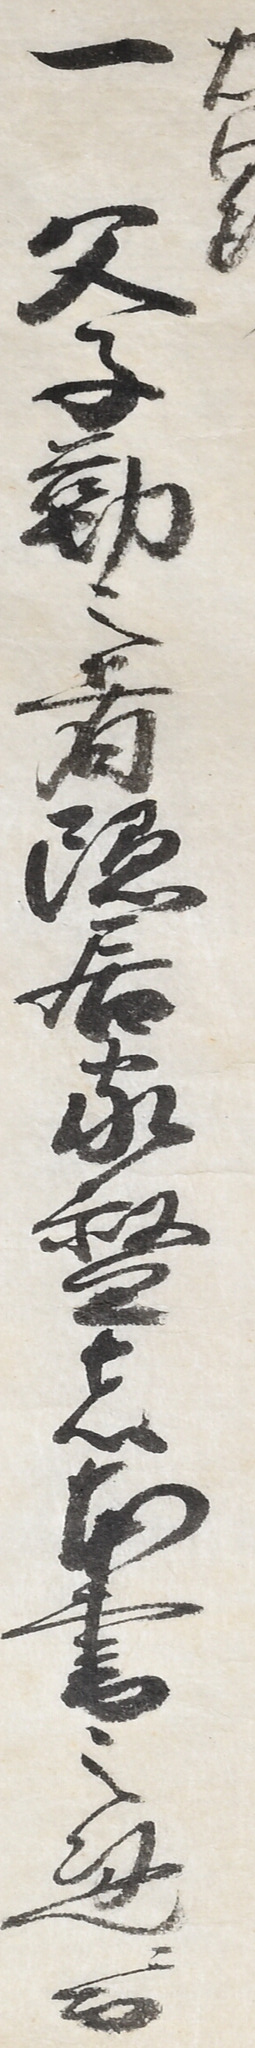一父子勤之者隠居家督は本書之通ニ而
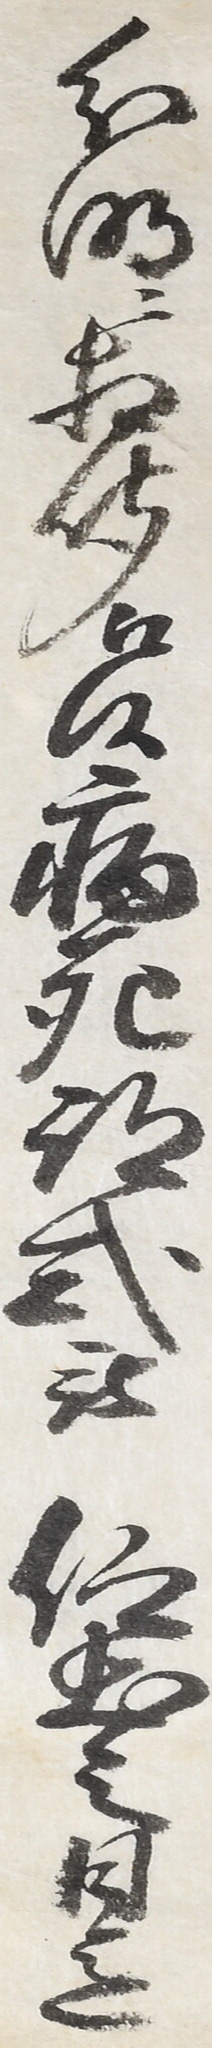分明ニ相聞江候病死跡式被仰出之日迄
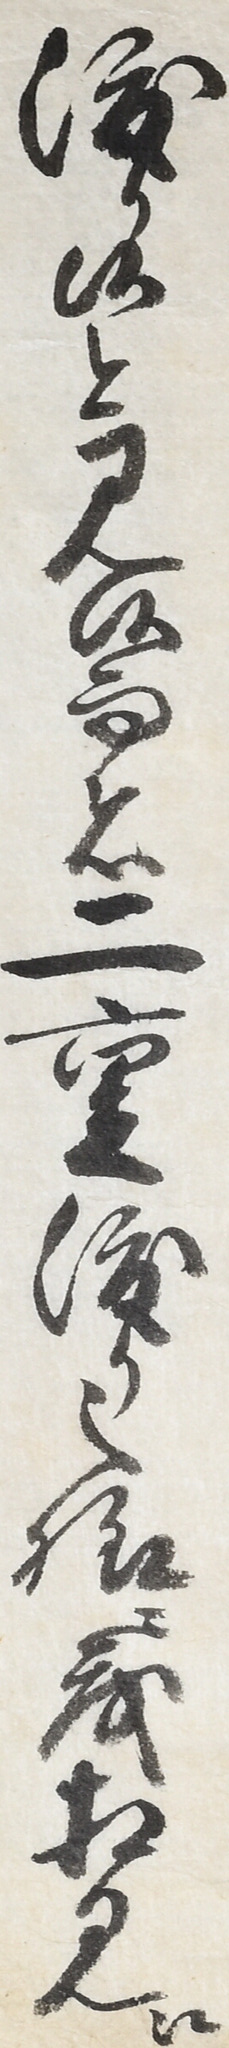渡り候と見候而は二重渡り之様ニも相見江
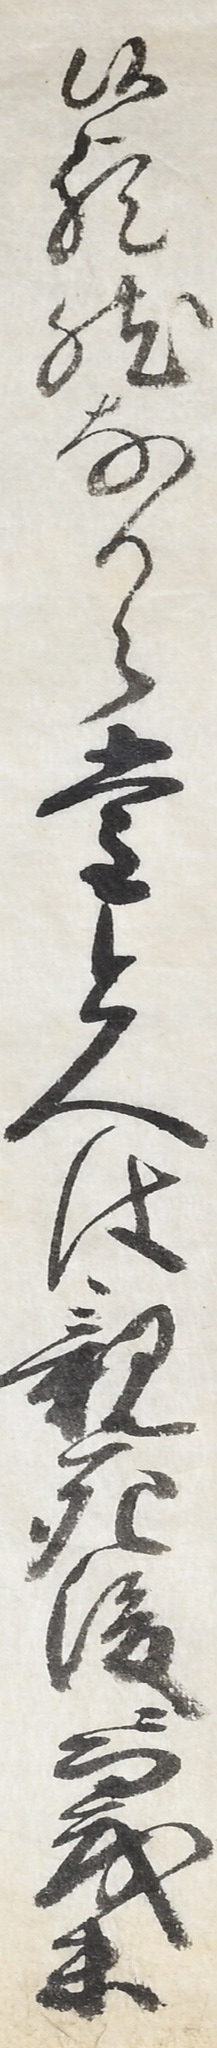候欤然なからたとへは親死後ニ而も未
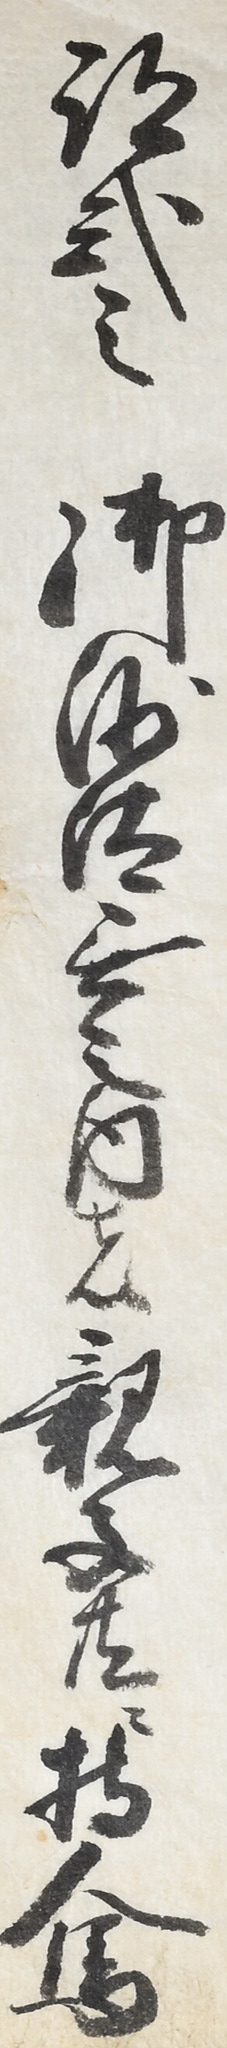跡式之御沙汰無之内は親子共ニ持人馬
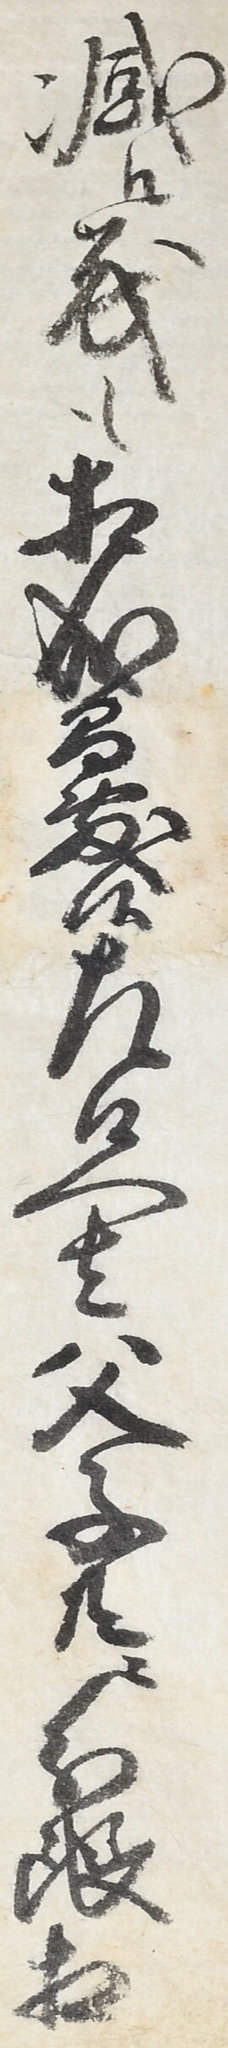減ル義も相成間敷候左候へは父子共ニ分銀相

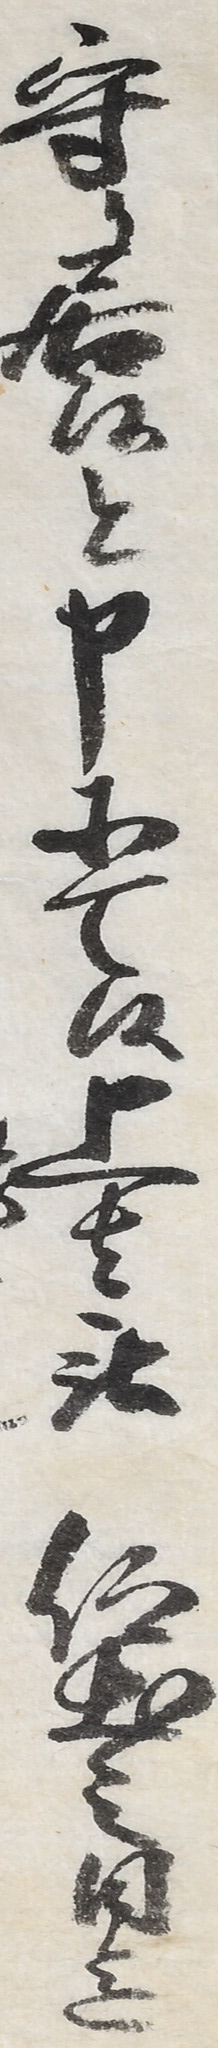守り居候と申にて候上は被仰出之日迄
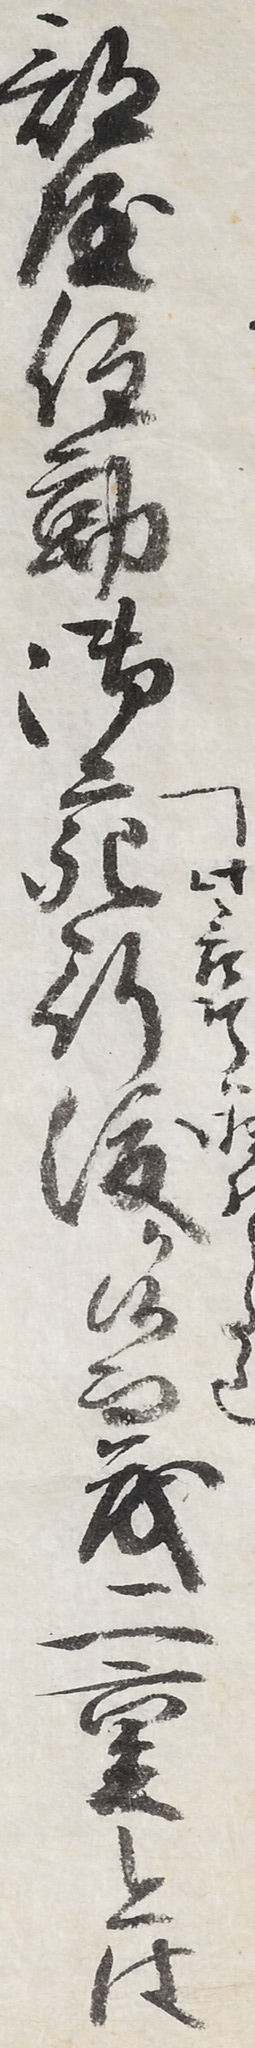部屋住勤御宛行渡り候而も二重とは
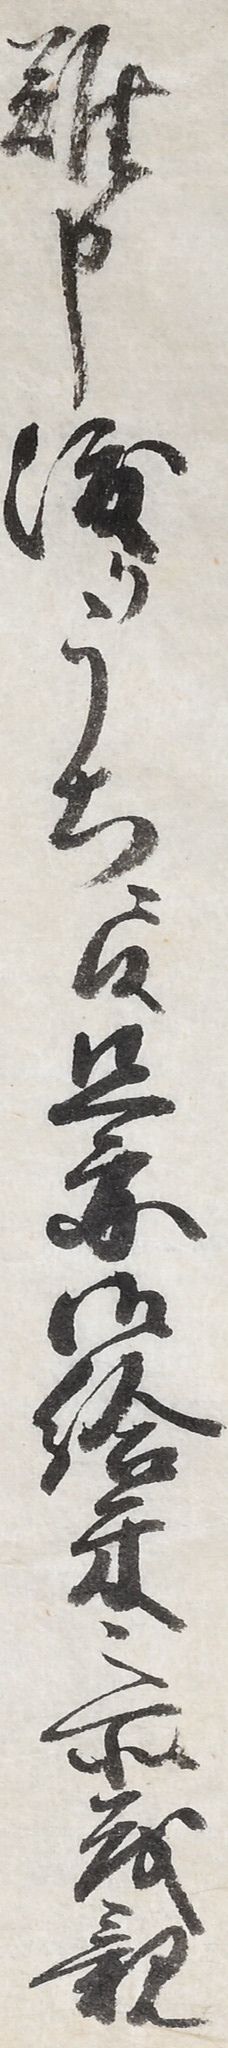難申渡りうちニ候且亦御給米之所も親
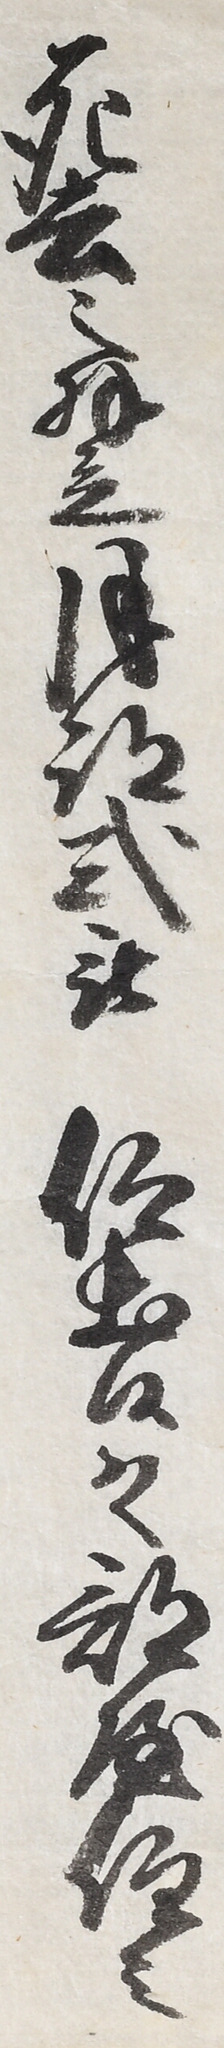死去之翌月跡式被仰出候ハヽ部屋住ミ
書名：御給分渡り方定追加
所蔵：伊那市立高遠町図書館・合同会社AMANE
